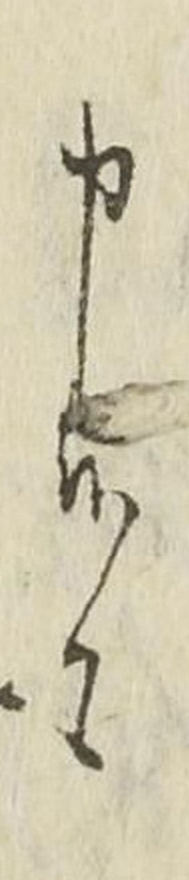申候以上
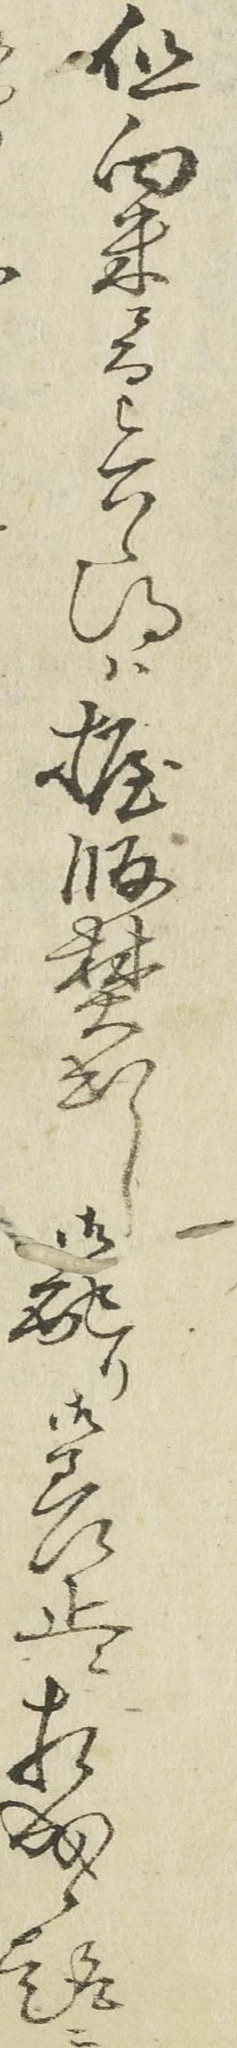但白米二而被召候得ハ握飯焚出し御配り御差止二相成候趣二
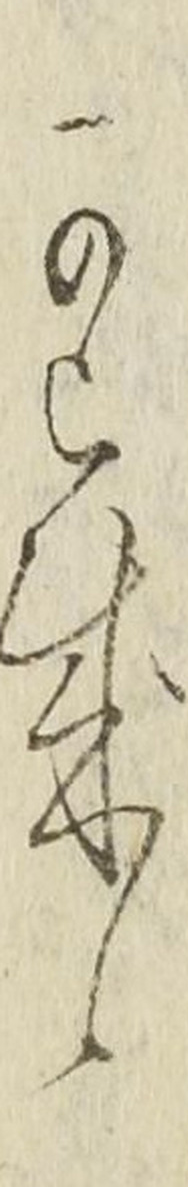可被成候
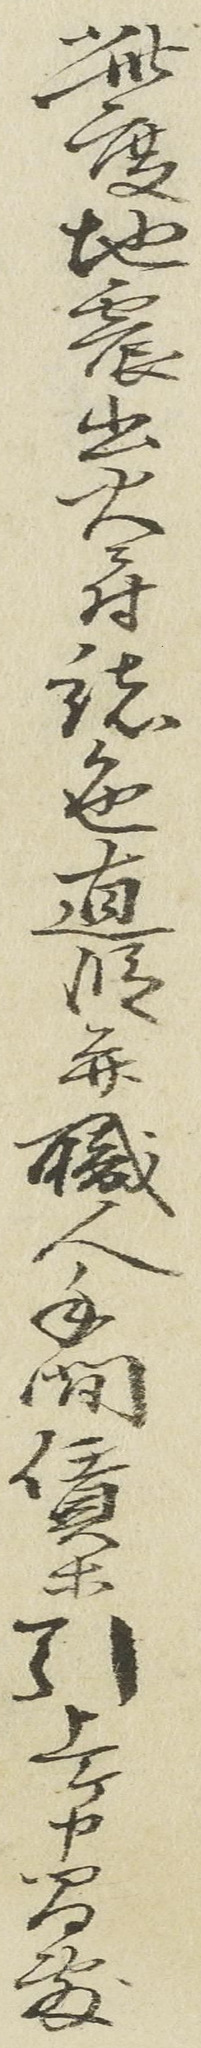此度地震出火二付諸色直段幷職人手間賃等引上ケ間敷
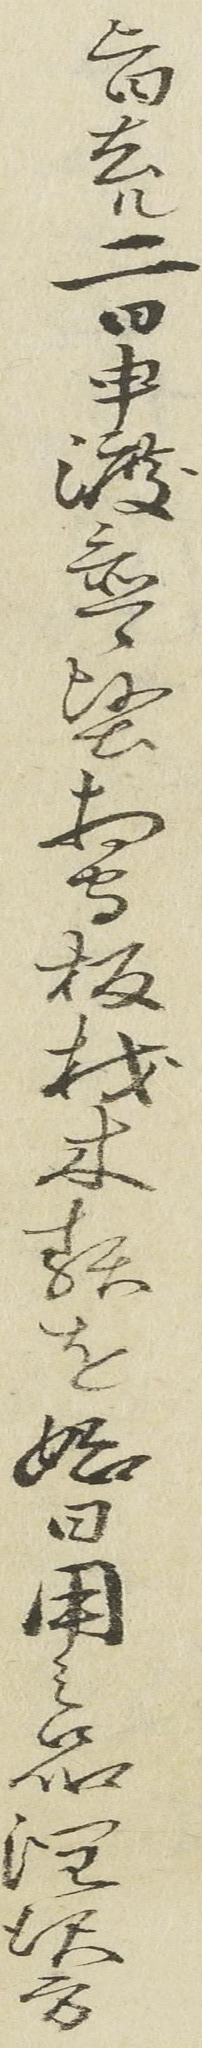旨去ル二日申渡置候堅相守板材木類を始日用之品潤沢方
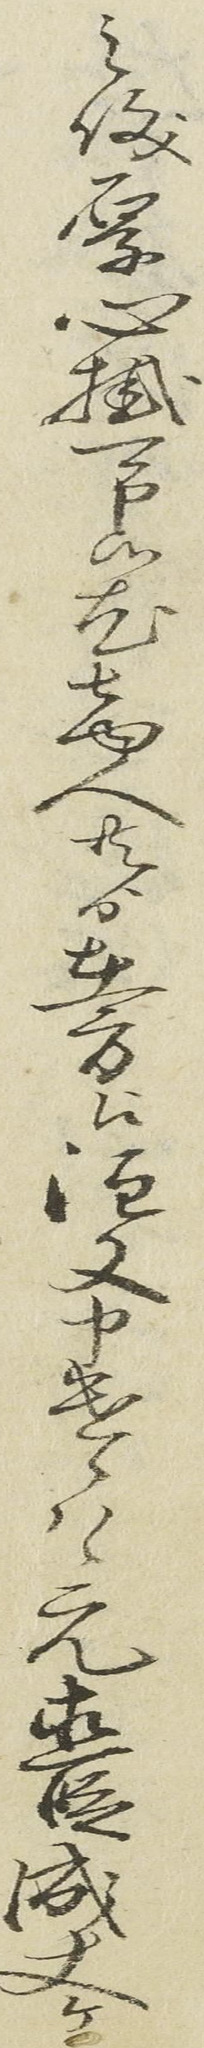之儀厚心掛可申候尤商人共ゟ在方え注文申遣候ハゝ元直段成丈ケ
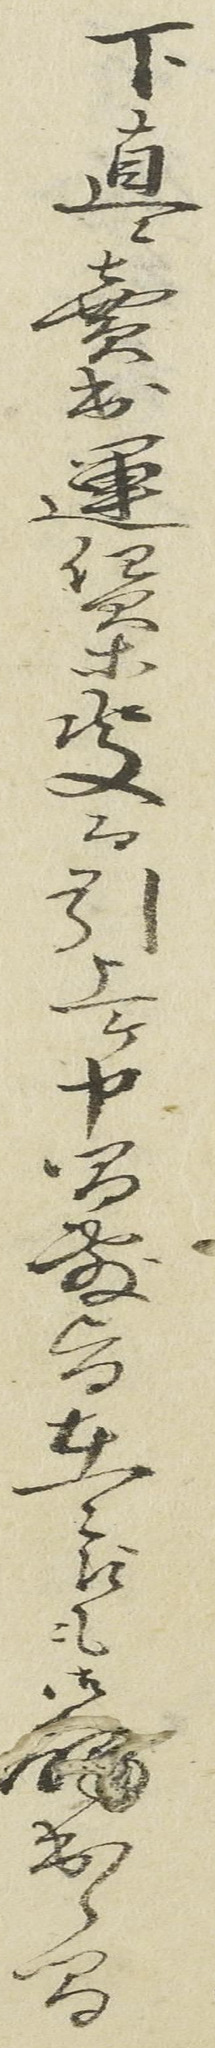下直二売出運賃等決而引上申間敷旨在々えも御触出候間
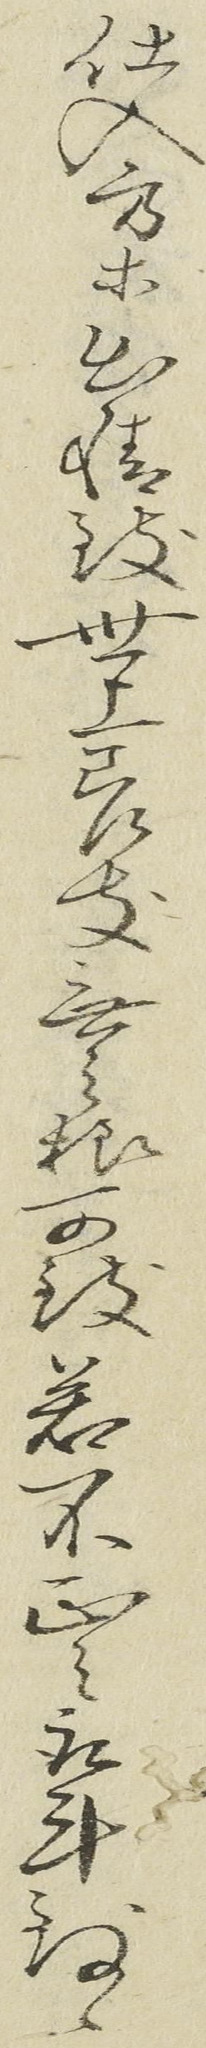仕入方等出情致世上差支無之様可致若不正之取斗致候

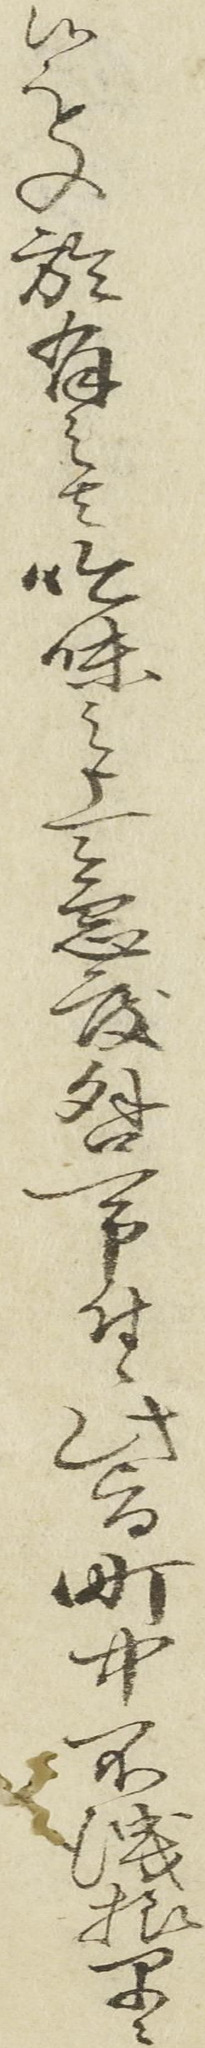候もの於有之は吟味之上急度咎可申付候此旨町中不洩様早々
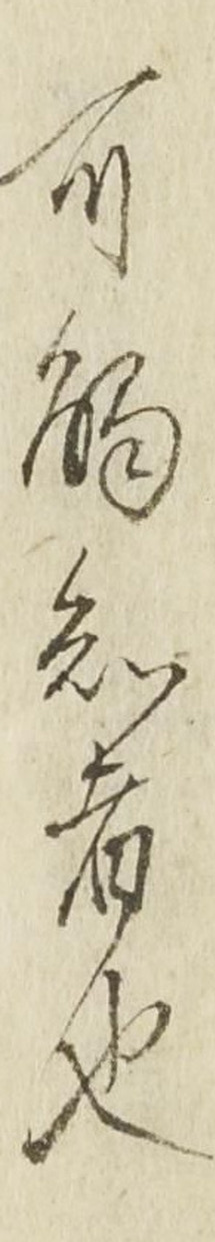可触知者也
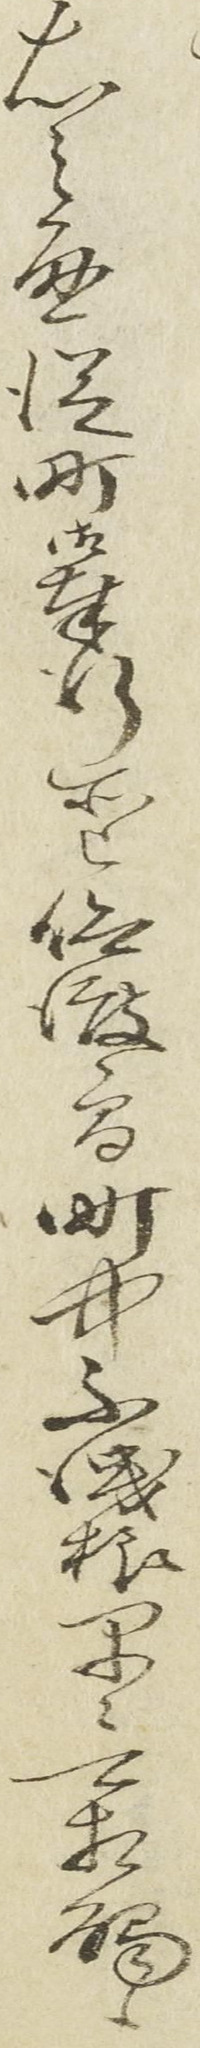右之通り従町御奉行所被仰渡候間町中不洩様早々可相触候もれる
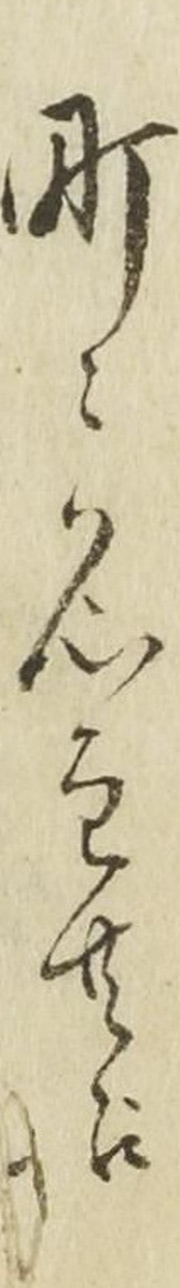町々名主共え
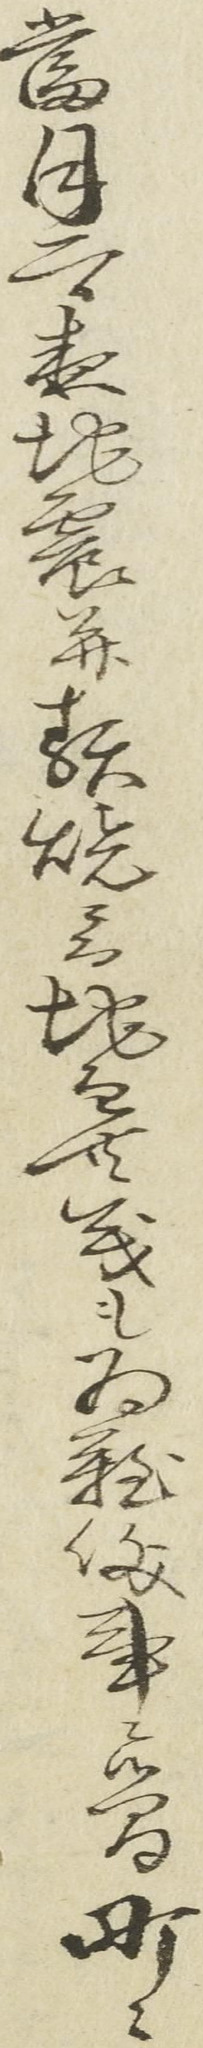當月二日夜地震幷類焼二而地主共義も為難儀事二候間町々
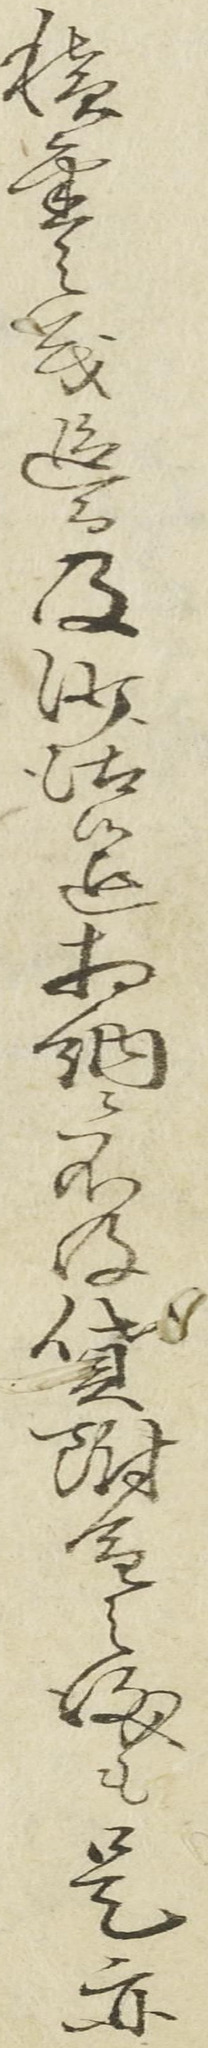積金之義追而及沙汰候迄相納二不及貸附金之儀も是亦
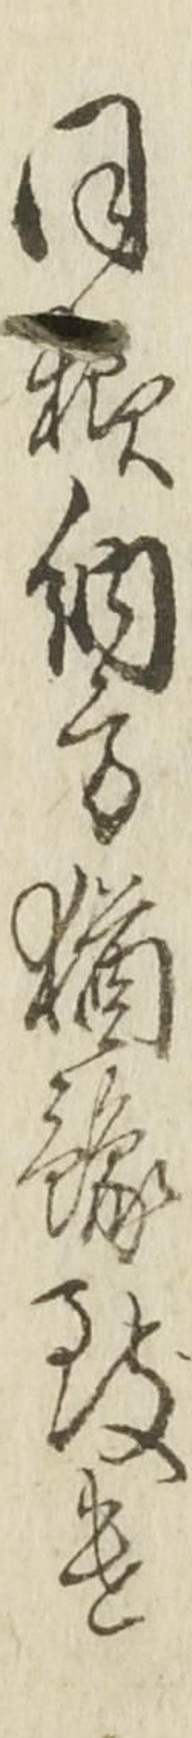同様納方猶予致遣
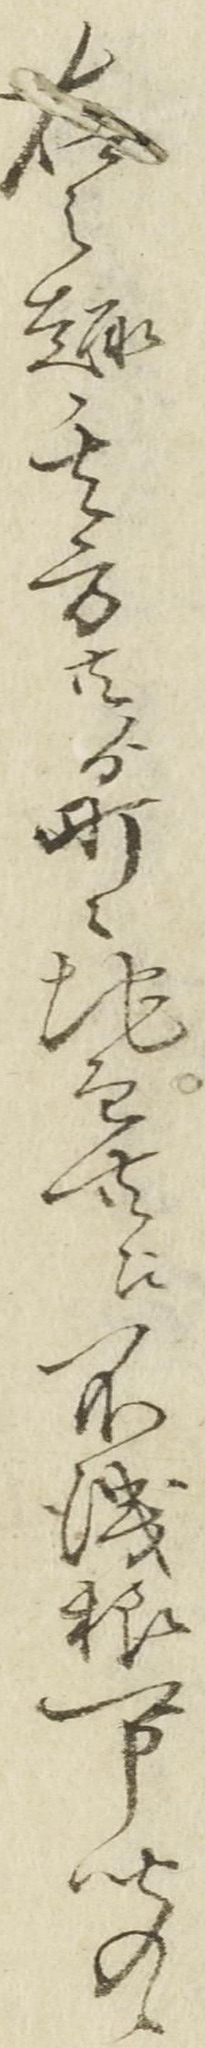右之趣其方共ゟ町々地主共え不洩様可申聞候
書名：安政二乙卯年十月二日大地震之事
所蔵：東京大学地震研究所図書室 Earthquake Research Institute Library, The University of Tokyo, JAPAN
